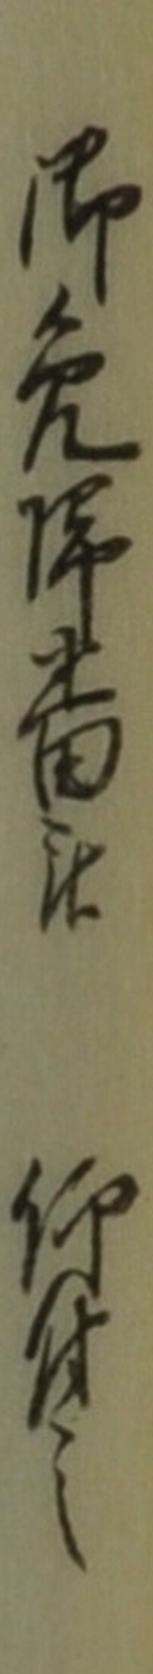御免帰番被仰付之
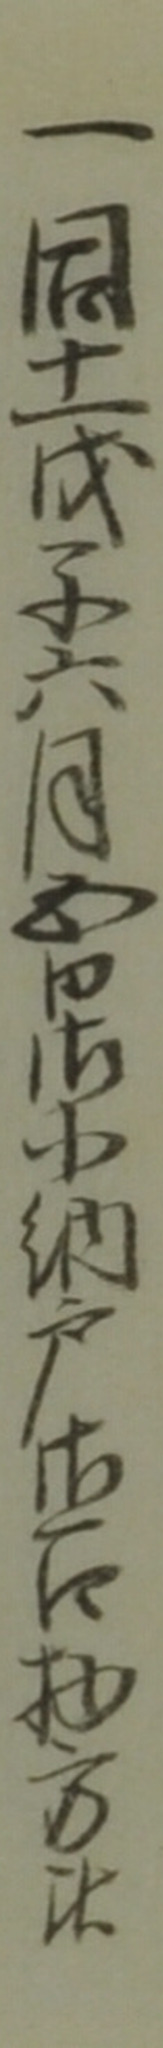一同十一戊子六月五日御小納戸御召物方被
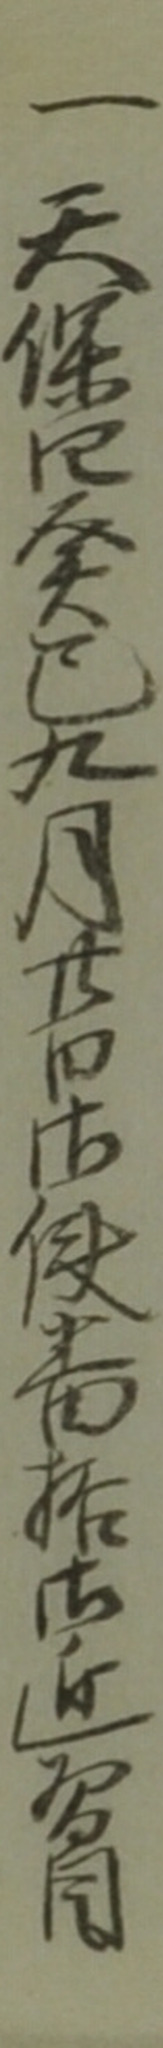一天保四癸巳九月廿日御使番格御近習目
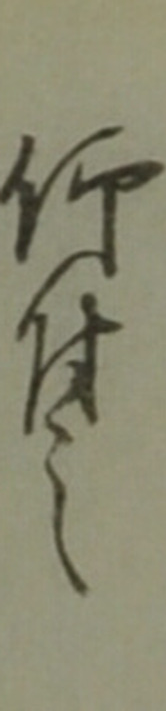仰付之
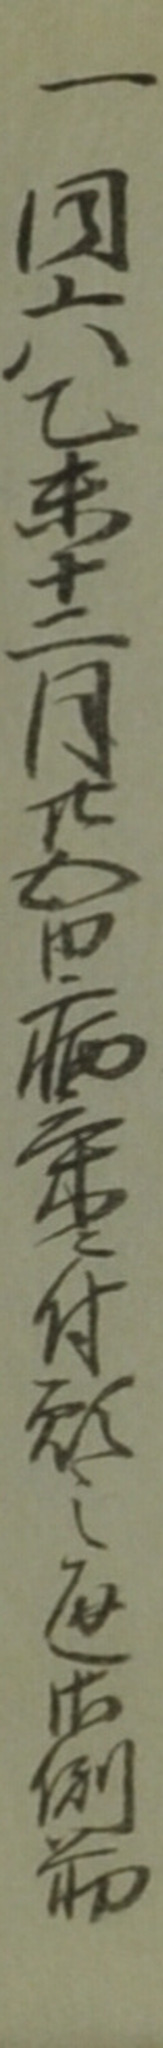一同六乙未十二月廿五日病気ニ付願之通御側勤
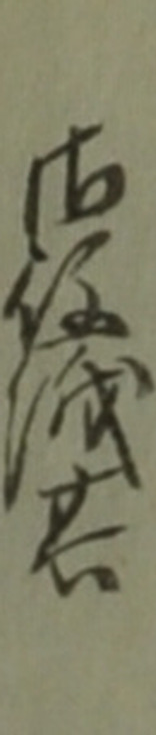御役儀共
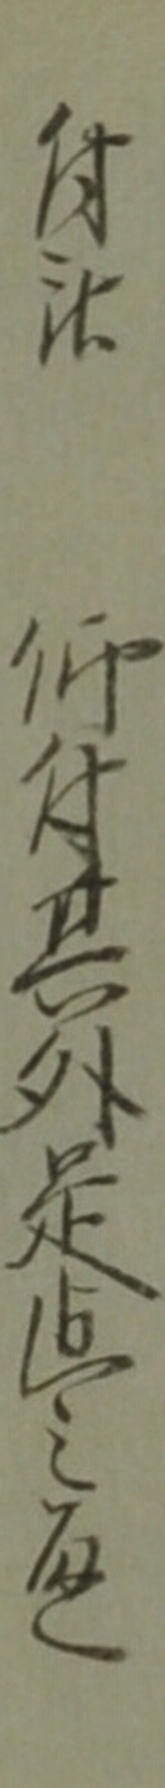付被仰付其外是迄之通
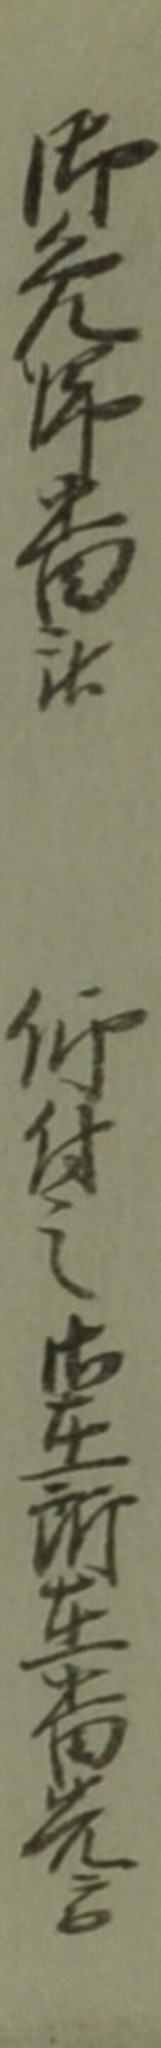御免帰番被仰付之御在所在番先ニ而
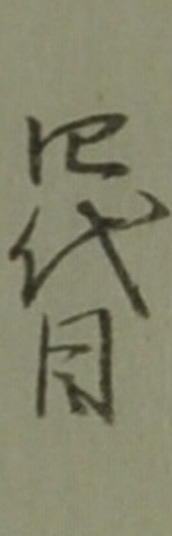四代目
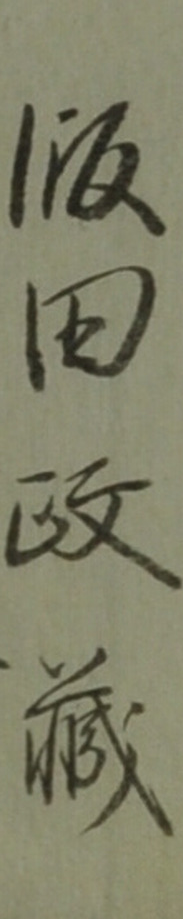飯田政蔵
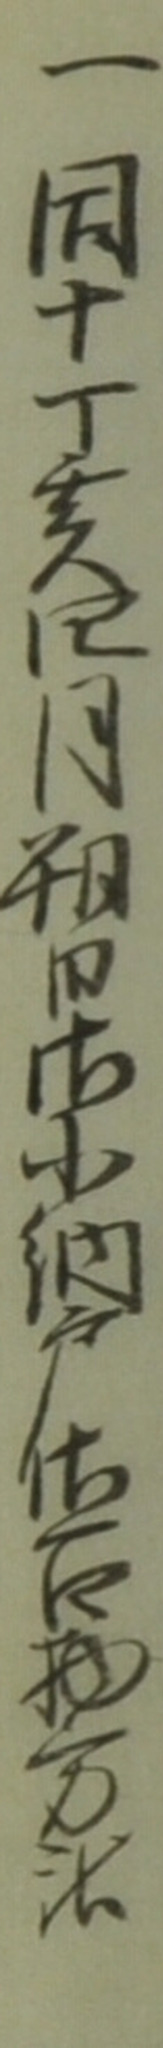一同十丁亥四月朔日御小納戸御召物方被
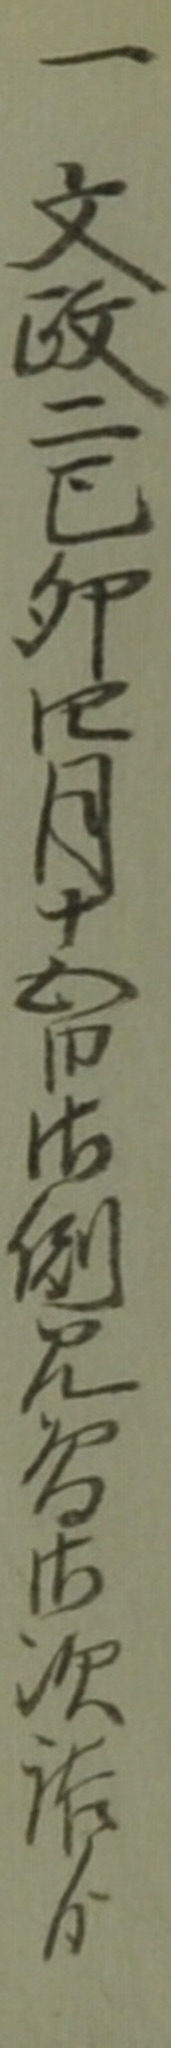一文政二己卯四月十五日御側見習御次格ゟ
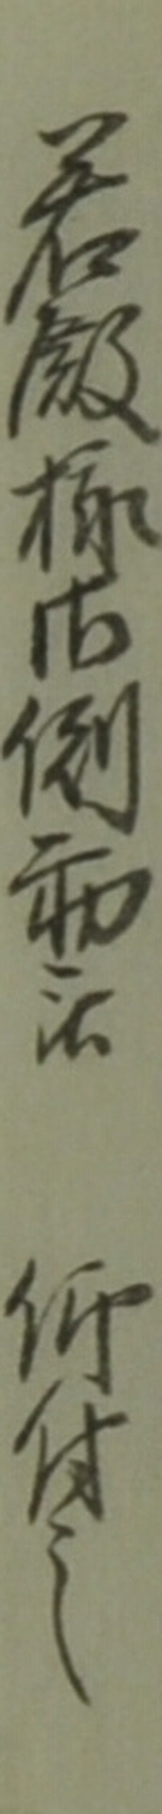若殿様御側勤被仰付之

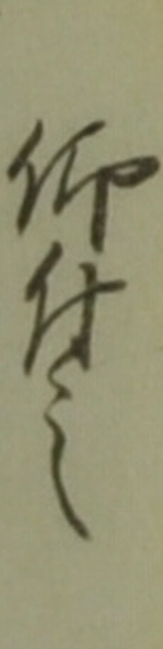仰付之
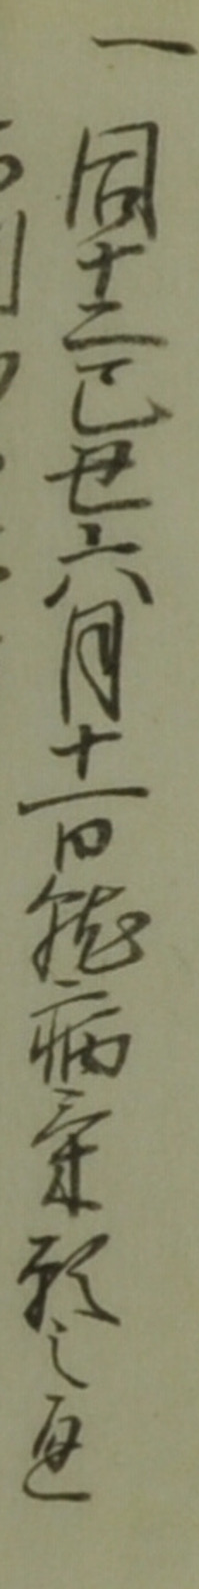一同十二己丑六月十一日就病気願之通
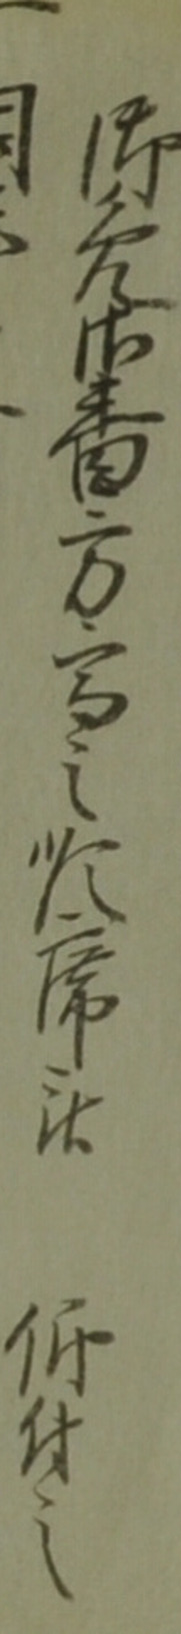御免御番方高之順席被仰付之
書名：諸御役代々録（五）
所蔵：伊那市立高遠町図書館・合同会社AMANE
